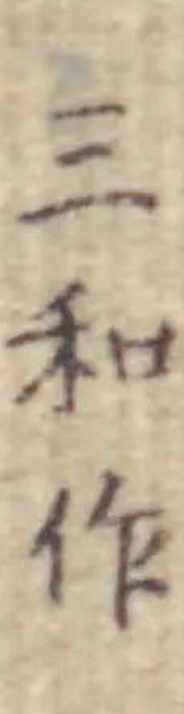三和作
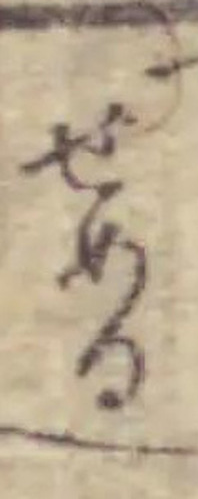せめる
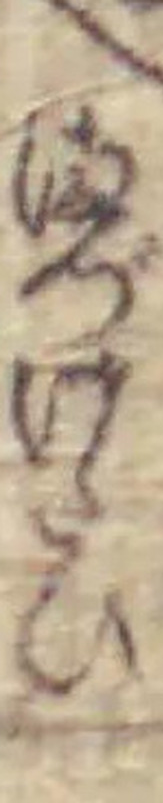まづけたひ
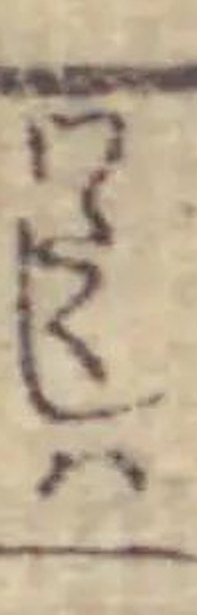わたくしは
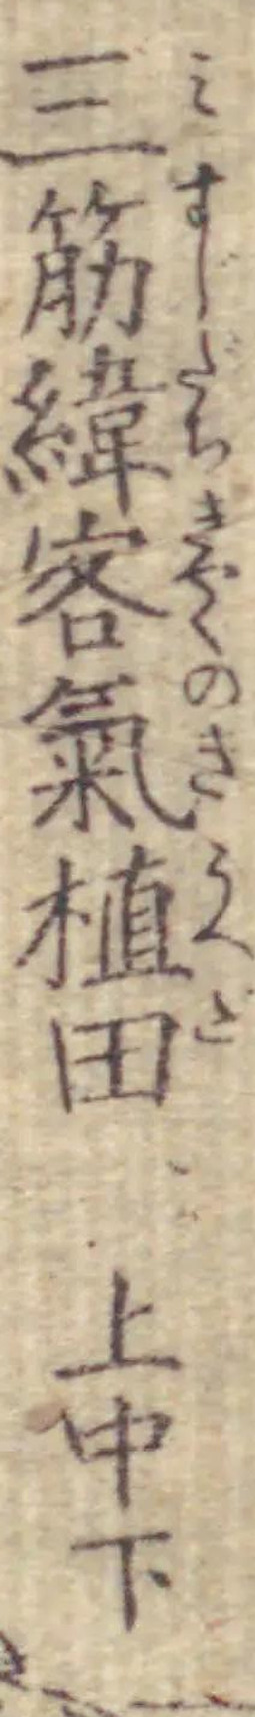三筋緯客気植田上中下
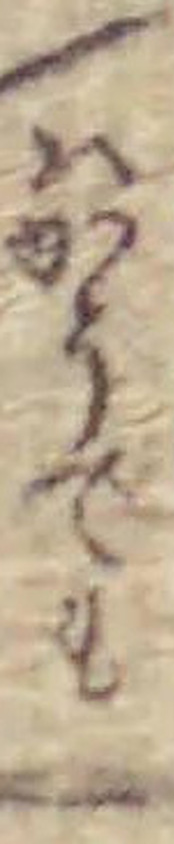はかうても
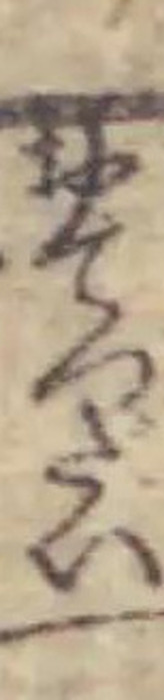おてつだい
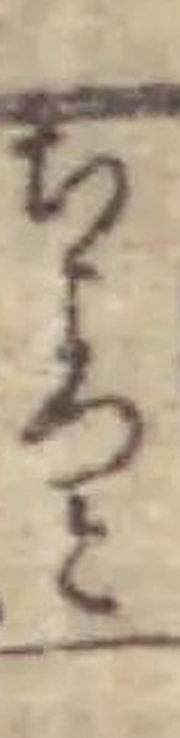ちよつと
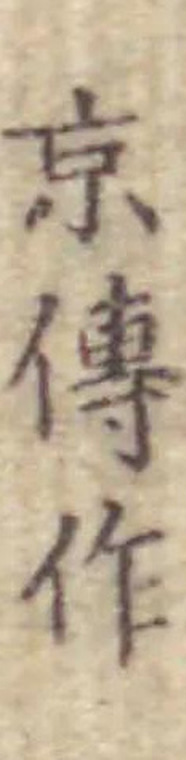京傳作
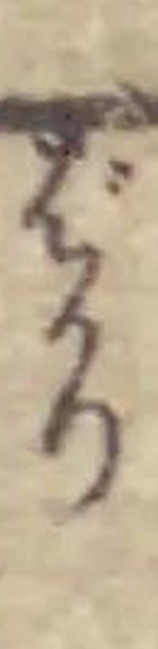ばかり
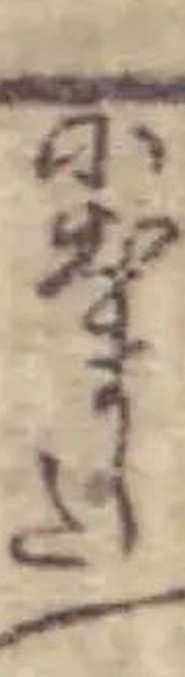に出ました
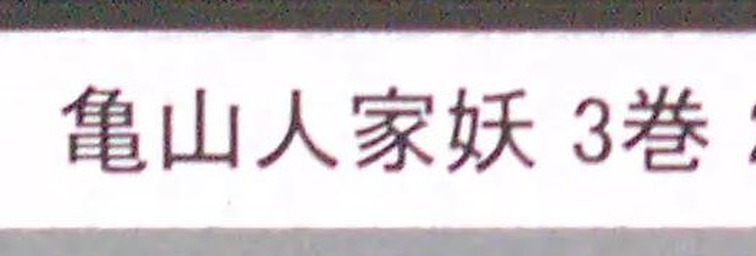亀山人家妖
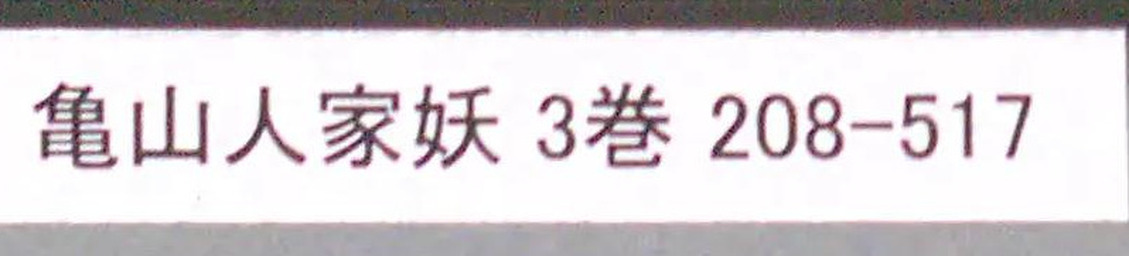亀山人家妖
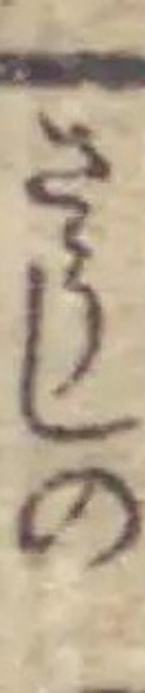さうしの
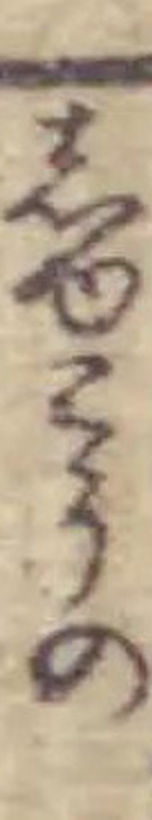しゆこうの
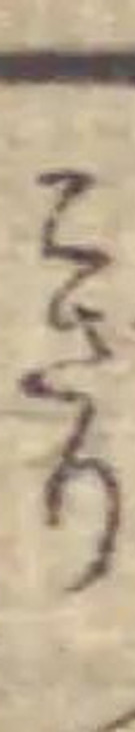こざり
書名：亀山人家妖 3巻
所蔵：国立国会図書館 National Diet Library, JAPAN
